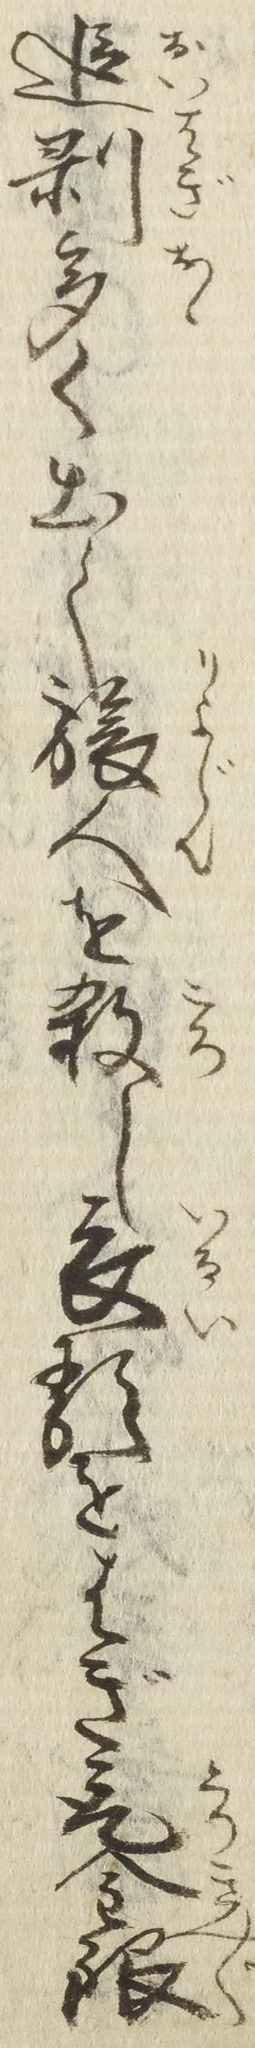追剥多く出て旅人を殺し衣類をはぎ取金銀

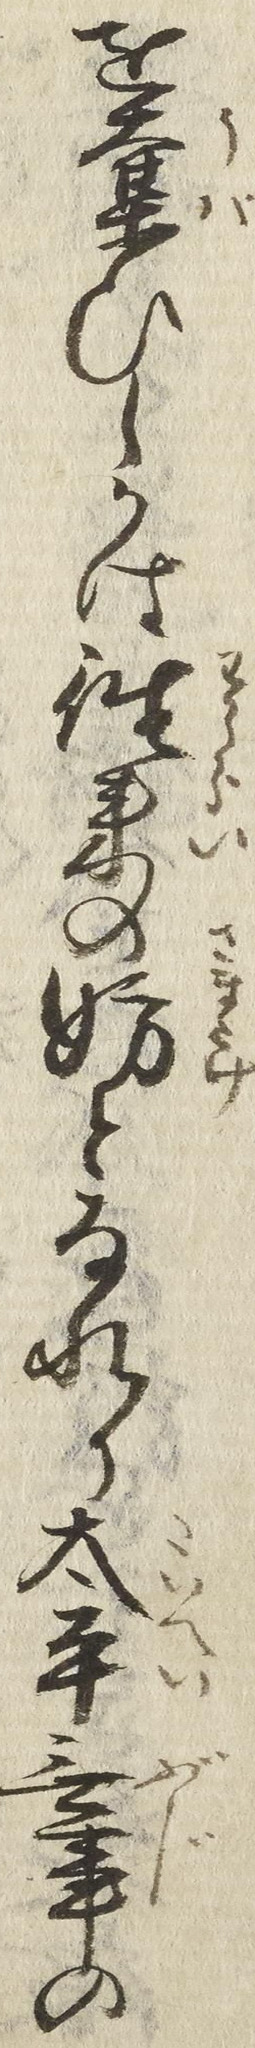を奪ひしかは往来の妨となれり太平無事の
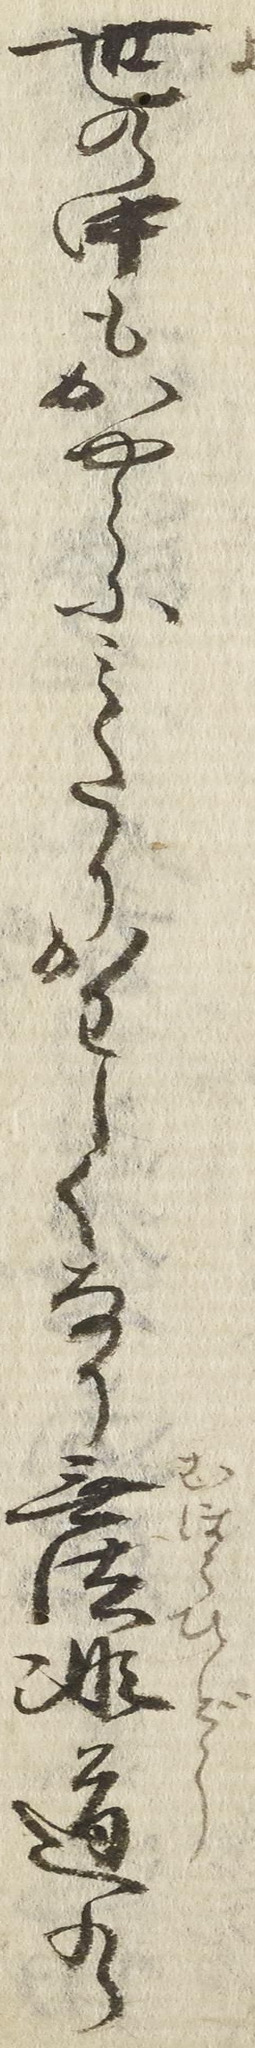世の中もかやうふにみたりかわしくなり無法非道の
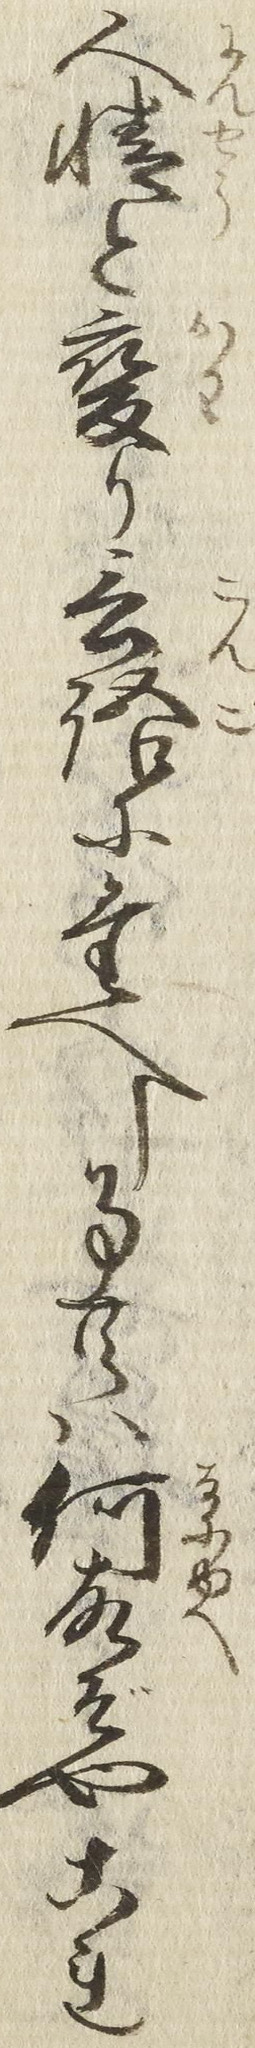人情と変り言語にたへしる共は何故ぞやこれ
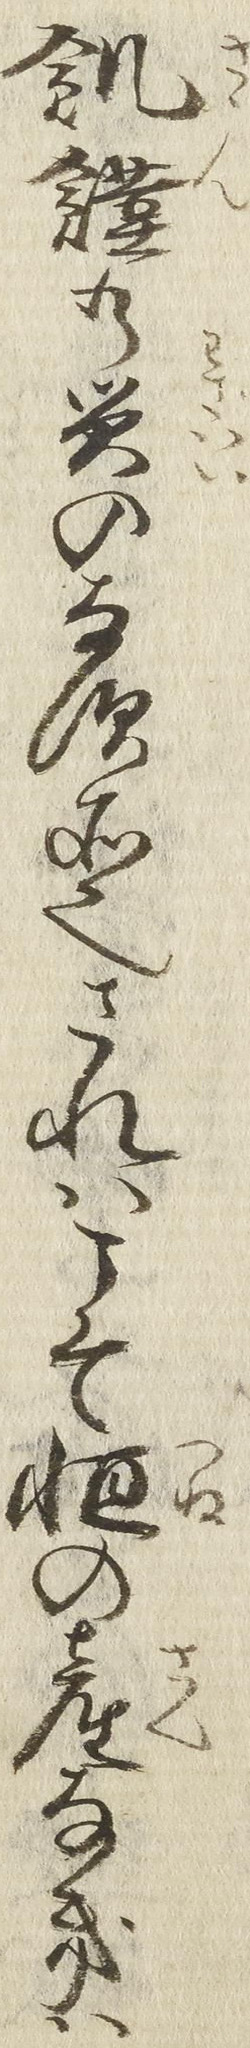飢饉の災のなす所也されはこそ恒の産なきは
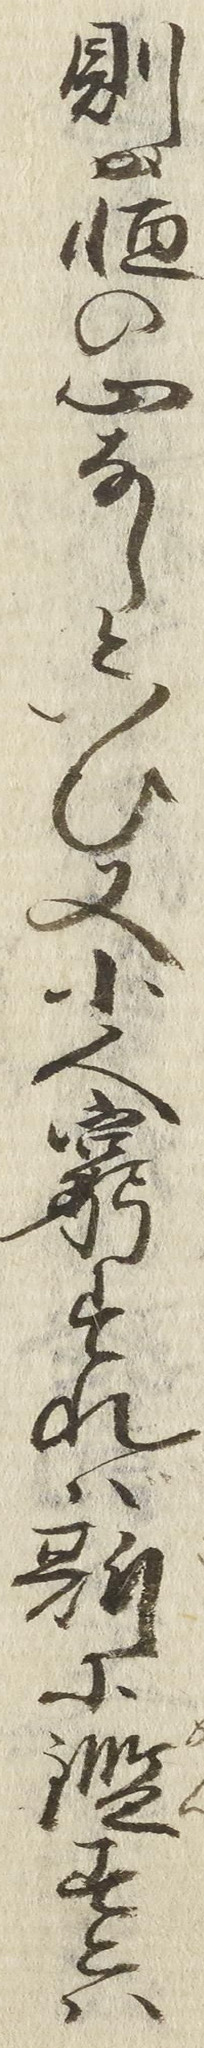則恒の心なしといひ又小人窮すれは斯に鑑すとは
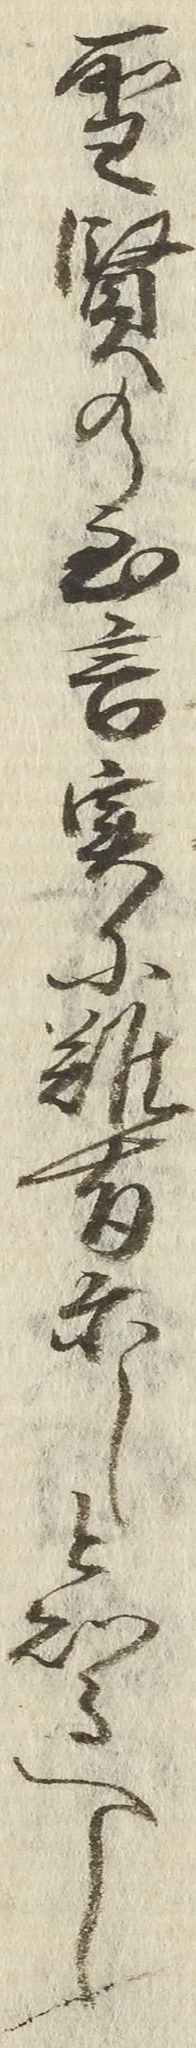聖賢の至言実に難有示しと知るへし
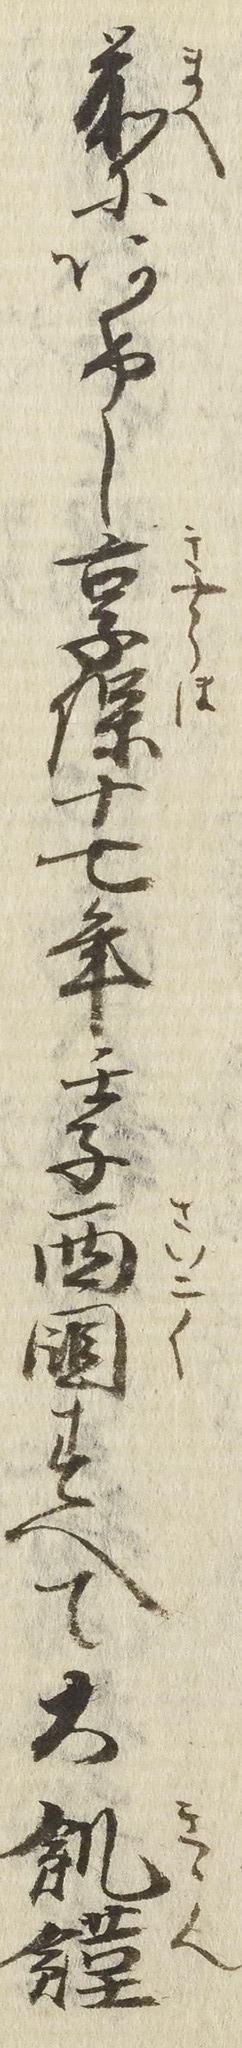前にあけし享保十七年壬子西国すへて大飢饉
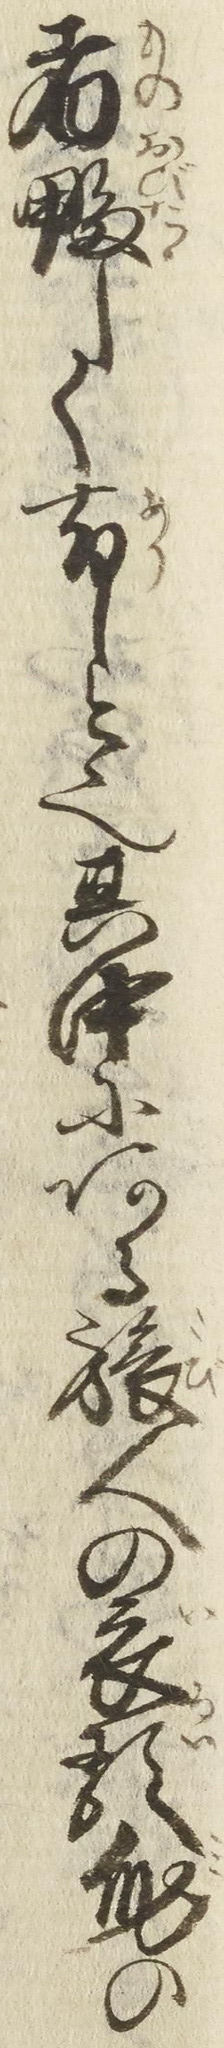者夥しく有と也其中にある旅人の衣類身の
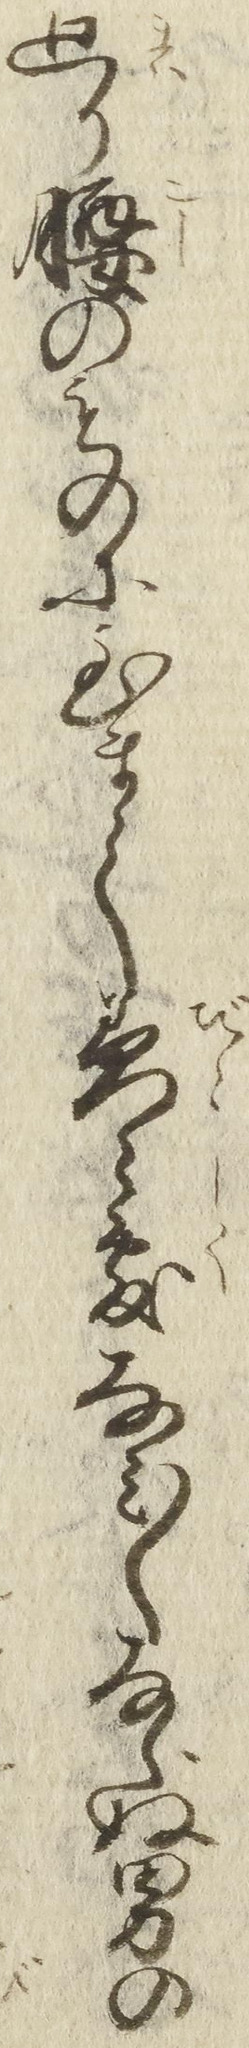廻り腰のものに至まて美〻敷なみ〳〵ならぬ男の
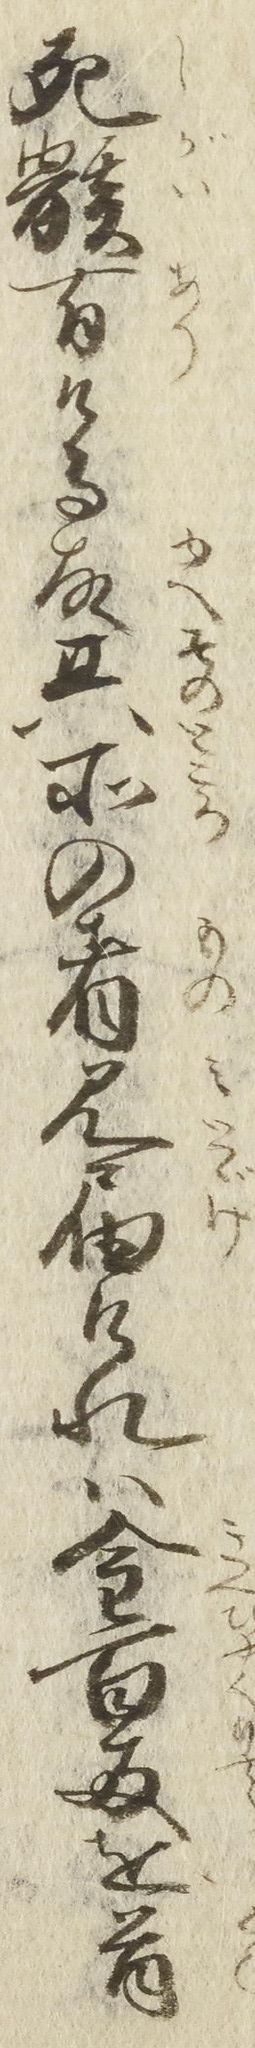死骸有ける故其所の者見届けれは金百両を首
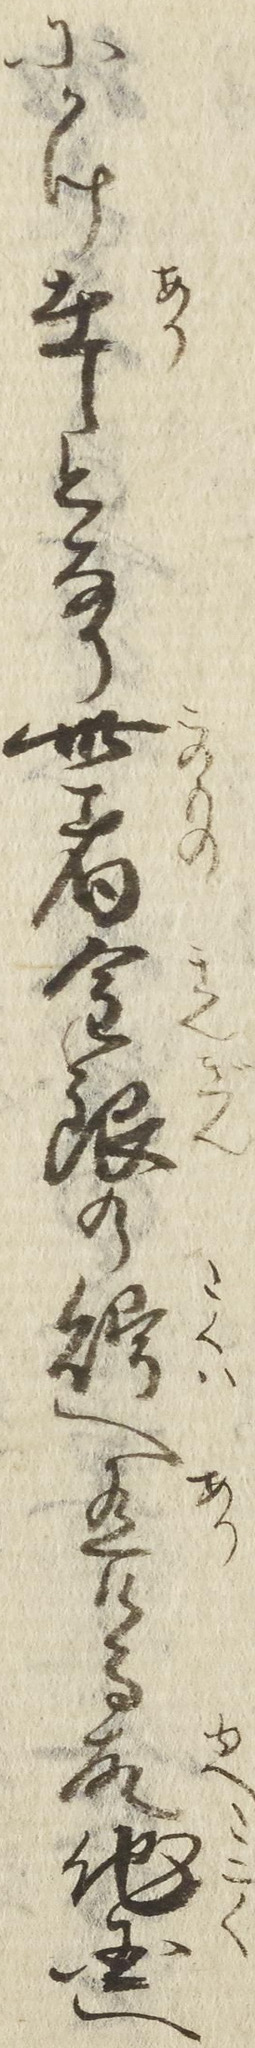にかけ在しとなり此者金銀の貯へ有ける故他国へ
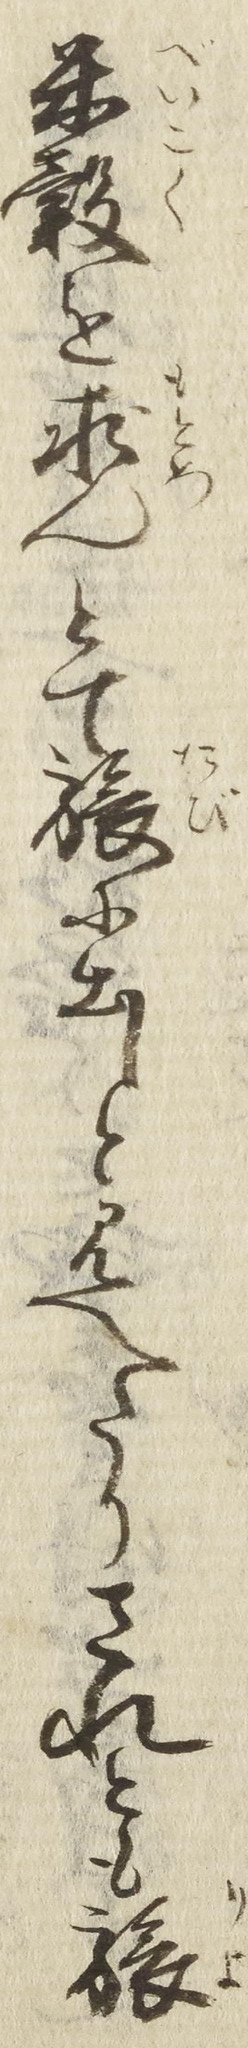米穀を求んとて旅に出しと見へたりされとも旅
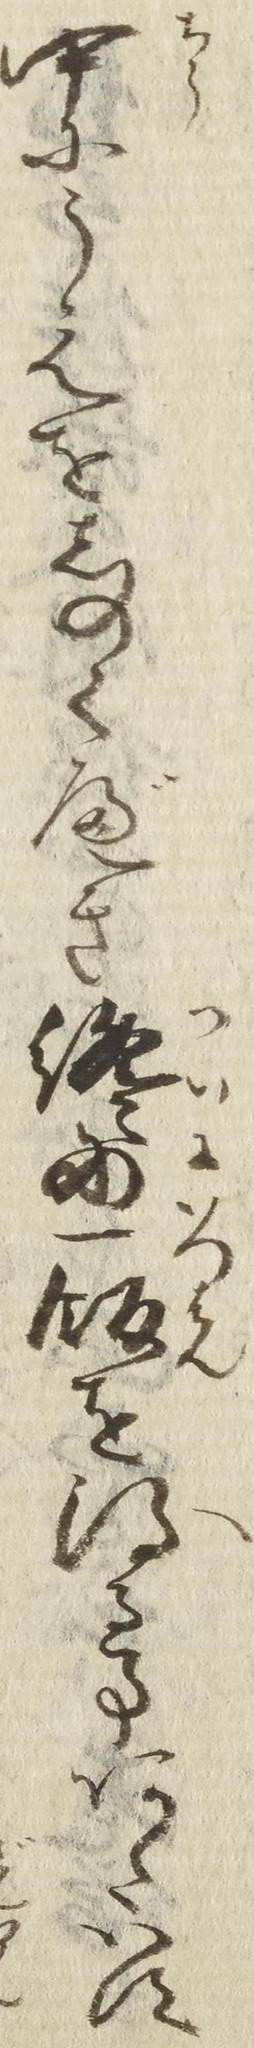中にうえをしのくべき終而一飯を得る事あたはす
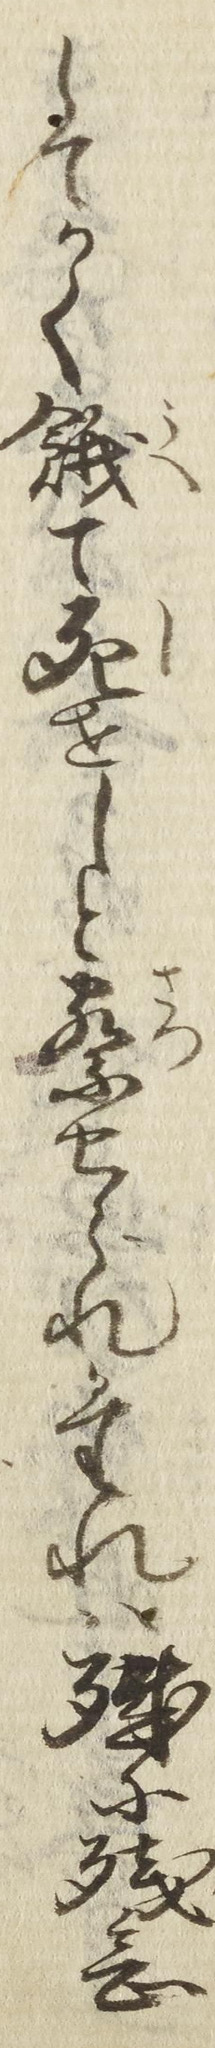してかく餓えて死せしと察せられたれは誠に残念
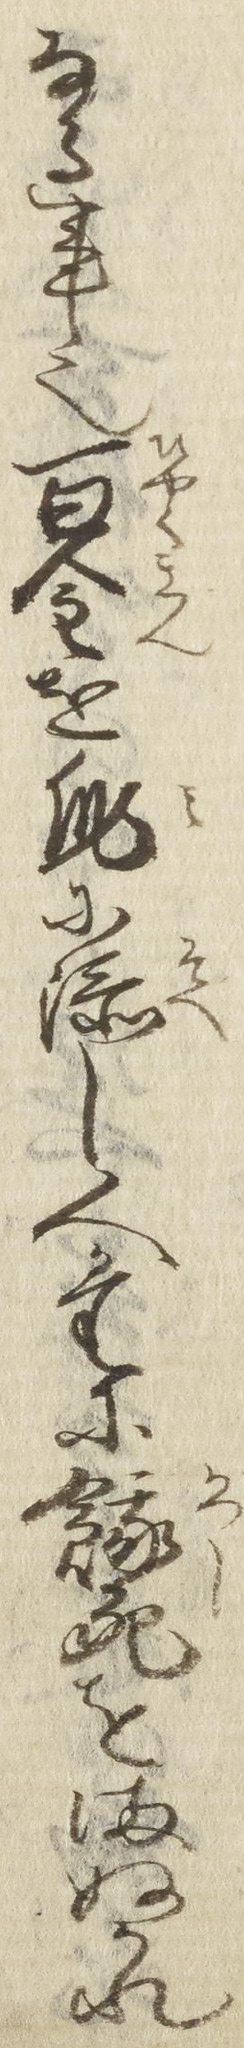なる事也百金を身に添し人たに餓死をまぬかれ
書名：天明奇畧　全
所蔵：東京大学地震研究所図書室 Earthquake Research Institute Library, The University of Tokyo, JAPAN
